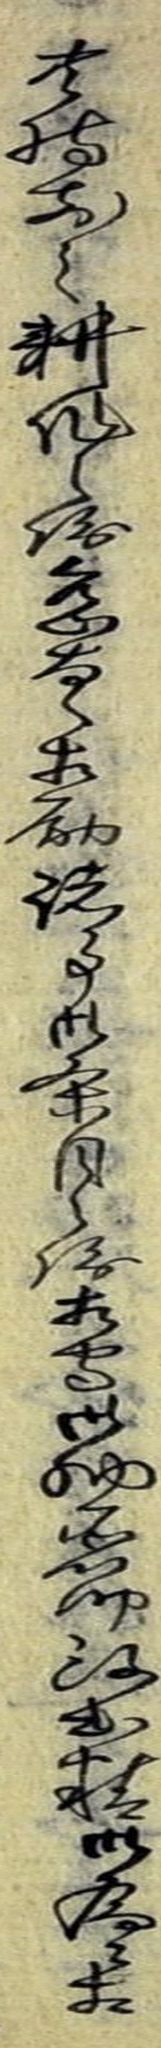共持前之耕作之儀怠なく相励諸事御条目之儀相守御納所筋致出精御為ニ相
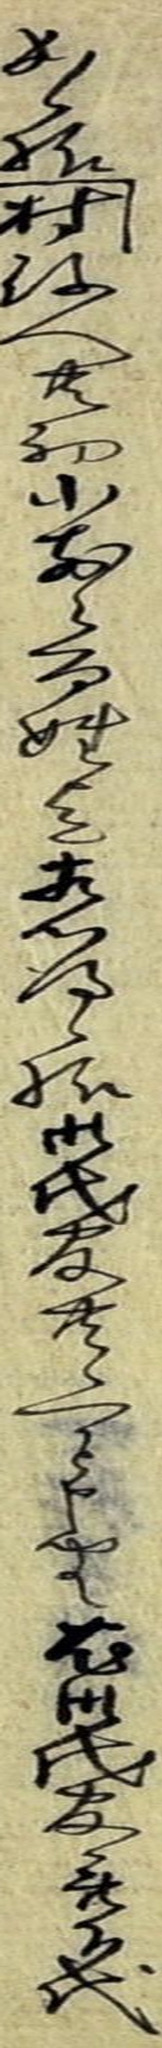成候様「村役人共初小前之百姓迄相心得候様御代官共へ可被申聞候尤御代官并下代
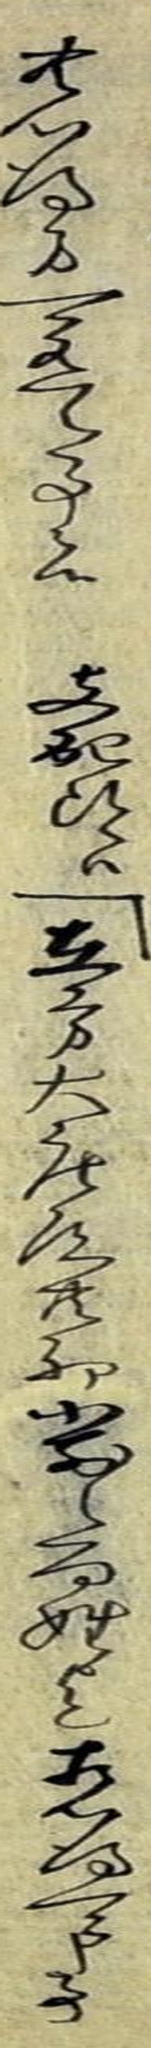共心得方可有之事ニ候支配頭ヘハ「在方大庄屋共初小前之百姓迄相心得可申事
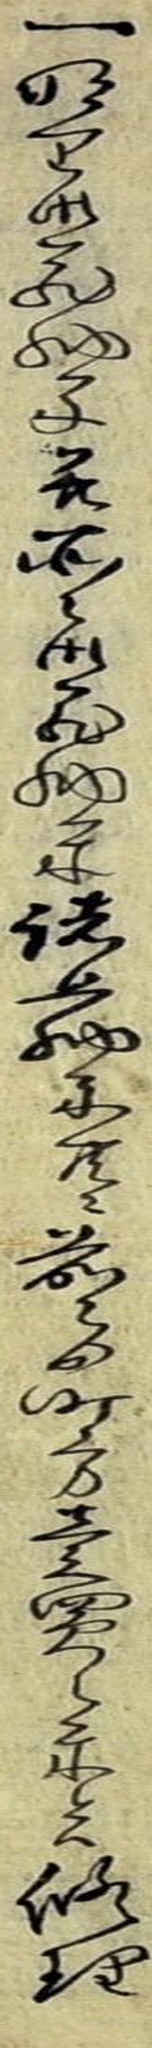一明里御蔵納米并所々御蔵納米諸上納米共ニ前々ゟ町方売買之米とハ修理
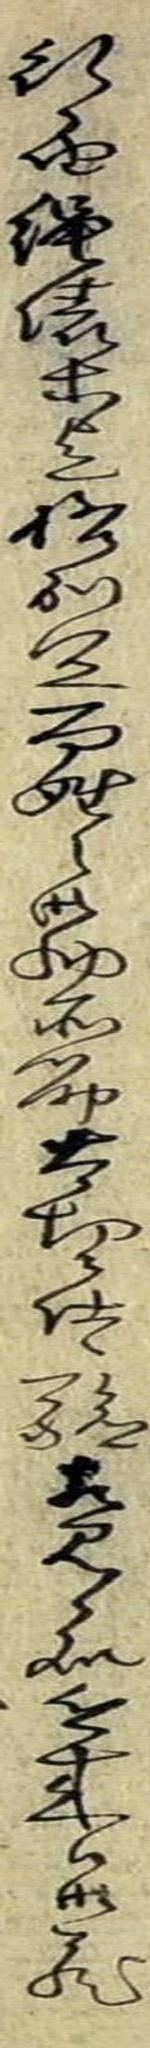行届縄俵等迄格別宜百姓之御納所筋太切ニ仕候験相見候処近来ハ御蔵
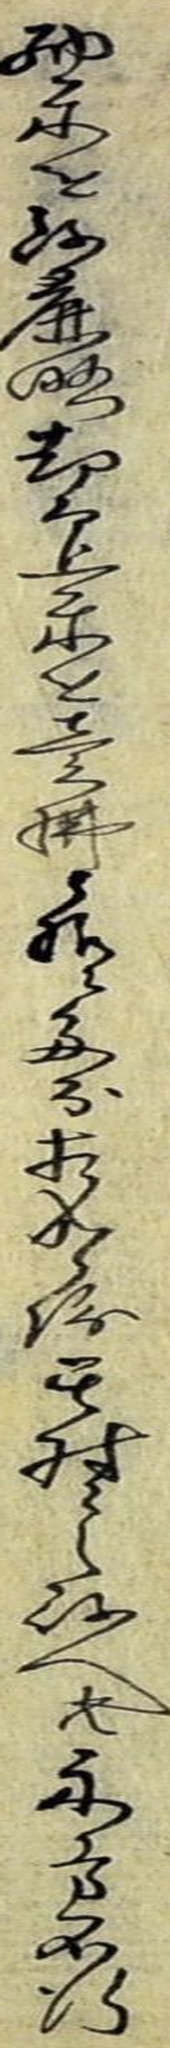納米を致麁略却而上米を売払候様ニ多分相成候儀其村々之役人共米方不行
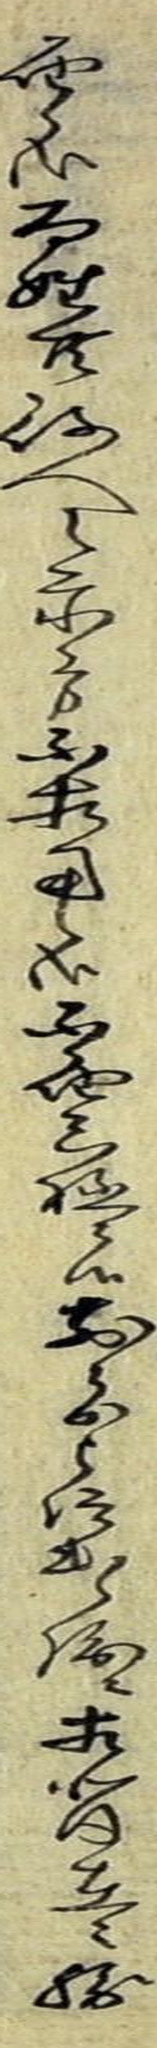届候哉百姓共役人之米方不相用候哉不届至極ニ候前々ゟ被仰出候儀ニ相背在々勝
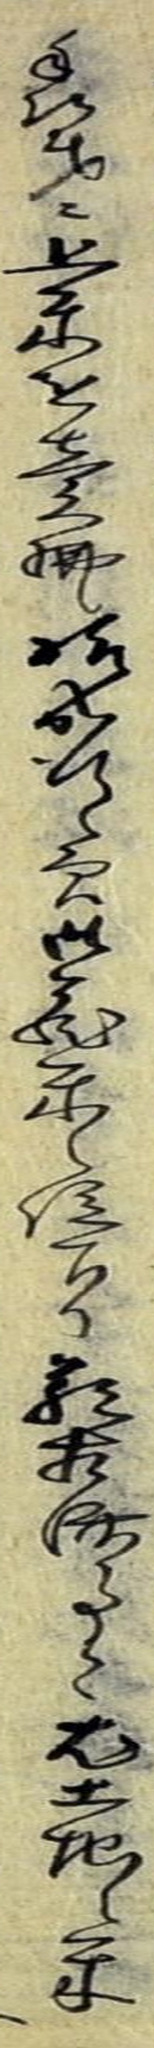手次第ニ上米を売払候様成行候而ハ御蔵米之位下り難相済事ニ候尤土地之米
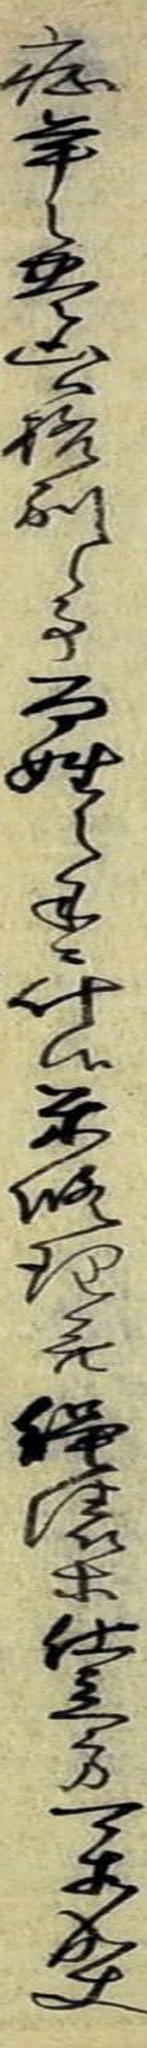症年之豊凶ハ格別之事百姓之手ニ叶候米修理并縄俵等仕立方可相成丈
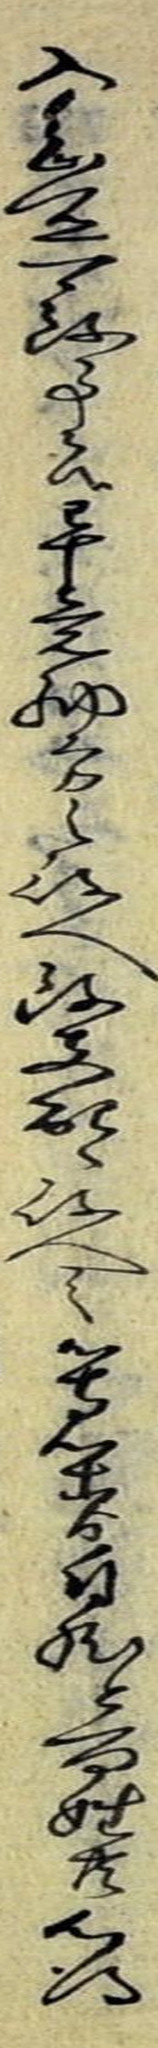入念宜可致事ニ候畢竟納方之役人致支配候役人之等閑ゟ自然と百姓共心得
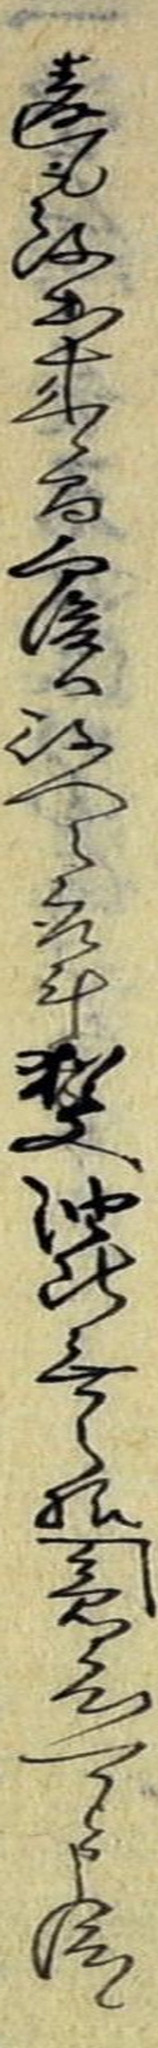違も致出来候間向後ハ役人之取計猶又油断無之様「急度可被申渡候
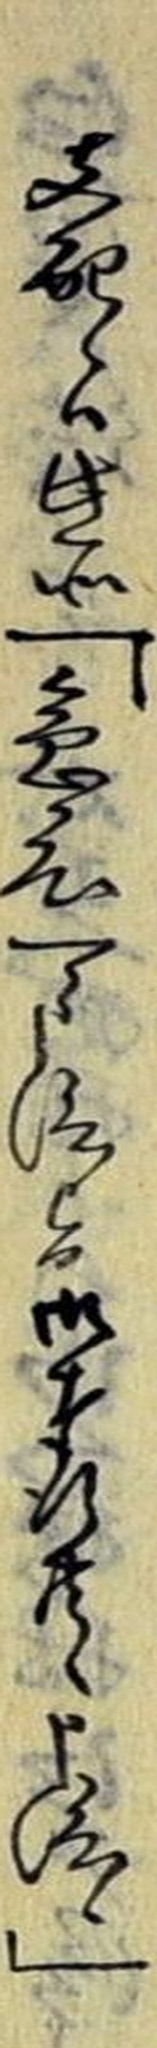支配ヘハ此所「急度可申渡旨御奉行共へ申渡候」
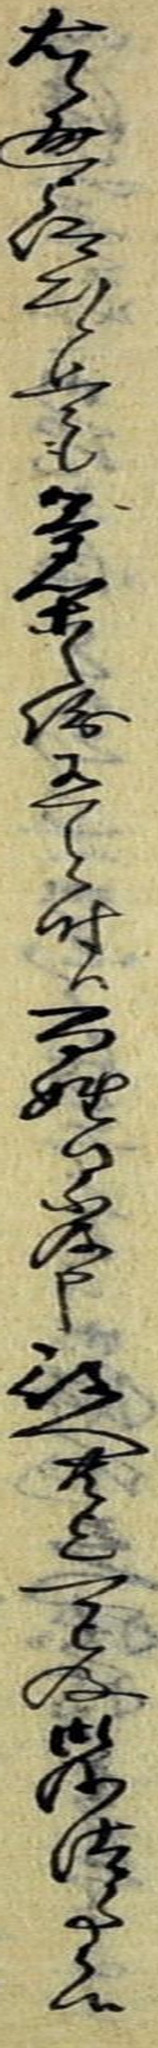右之通被仰出候上ニも等閑之儀有之時ハ百姓ハ不及申役人共迄可被及御沙汰事ニ候
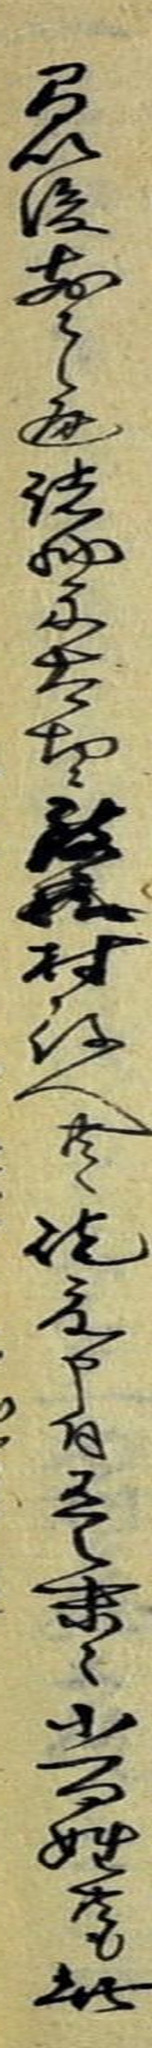間以後前々之通諸納米太切ニ致村役人共へ屹度申付有之末々小百姓共も此
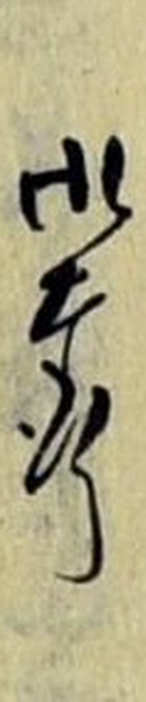御奉行
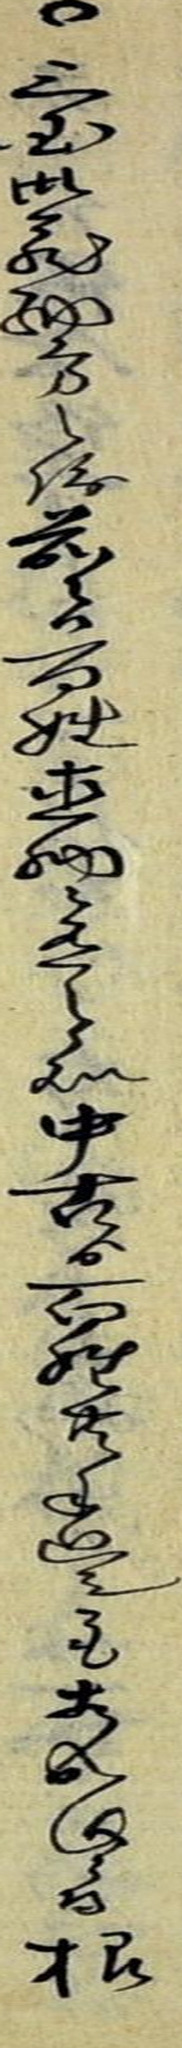〇三国御蔵納方之儀前々ハ百姓直納ニ有之候処中古ゟ百姓共手廻シニも相成趣ニ付根
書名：命令之部 三
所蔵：福井県文書館 Fukui Prefectural Archives
